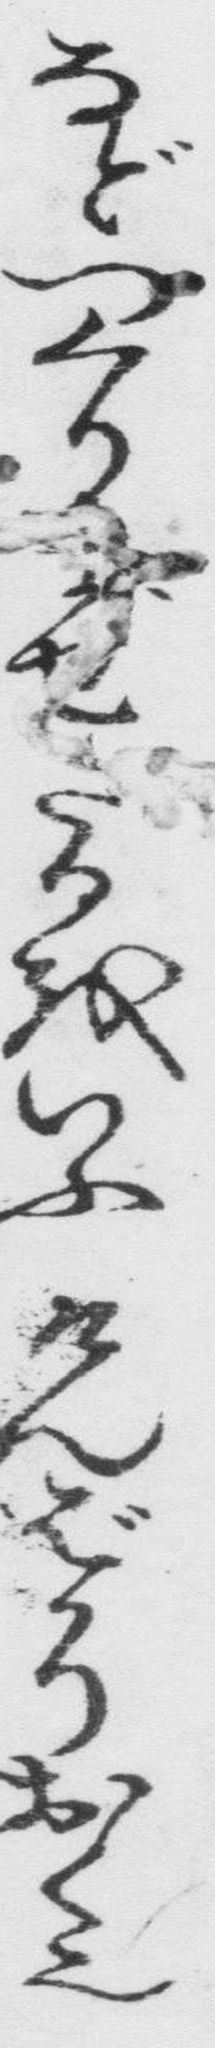などつくりまぜたるをいふけんばかりおく也
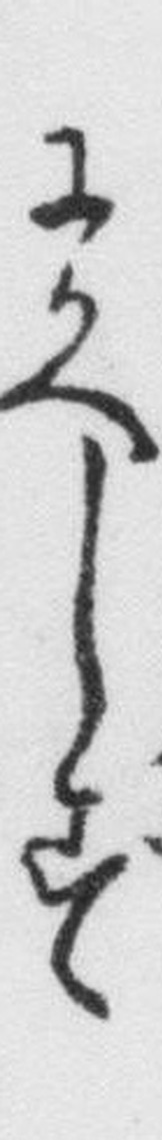にかへしず
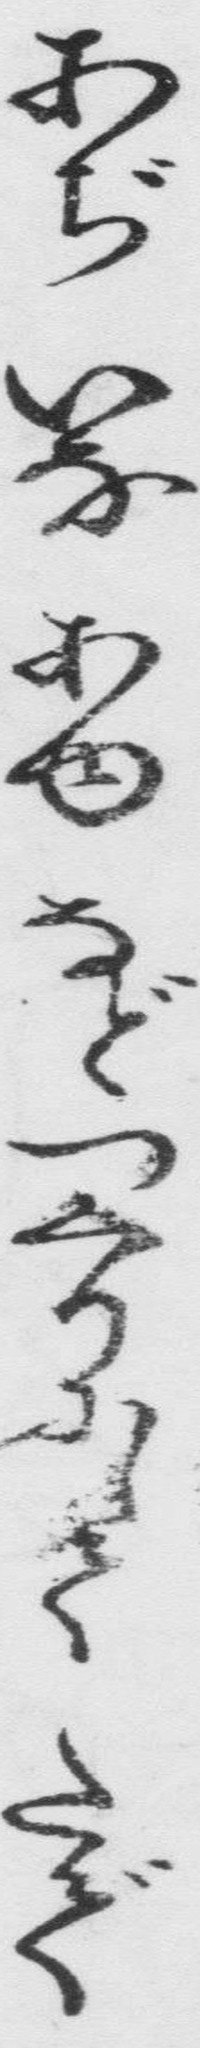あぢいなあゆなどつくりにしてたで
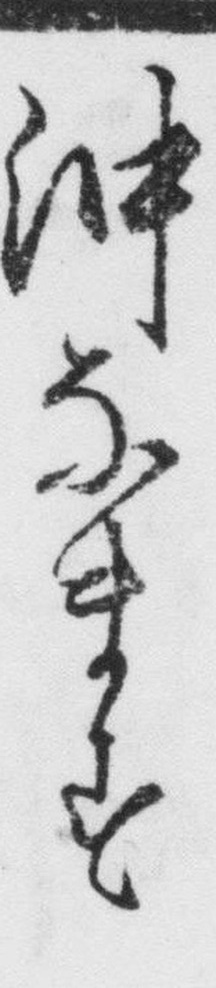沖なます
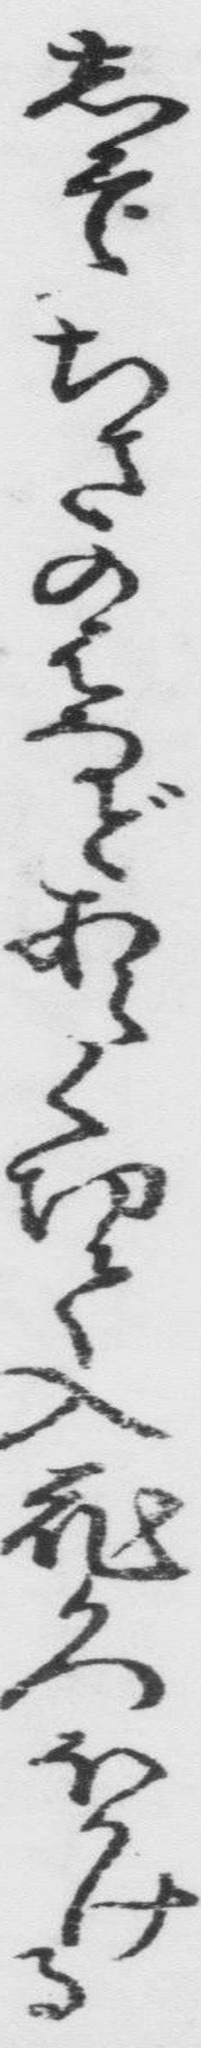しそちさのはなどあらく切て入花かつほかける
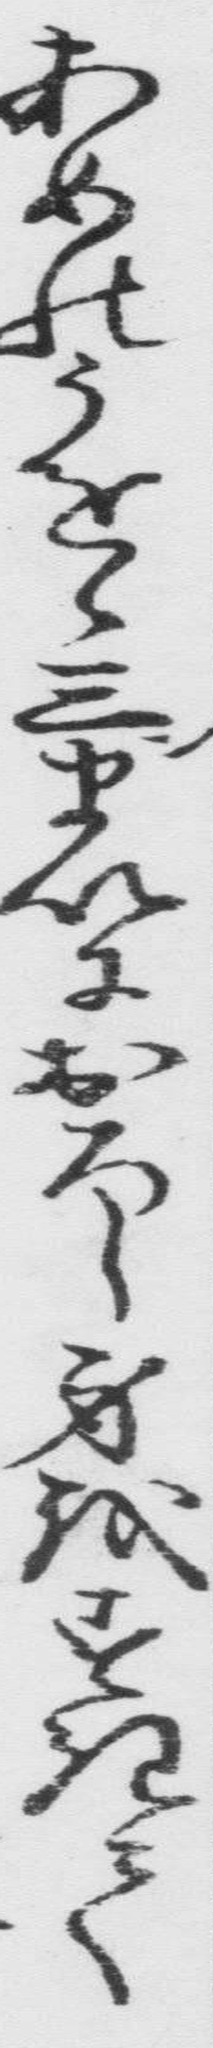あめのうをゝ三んまいにおろし身をすきて
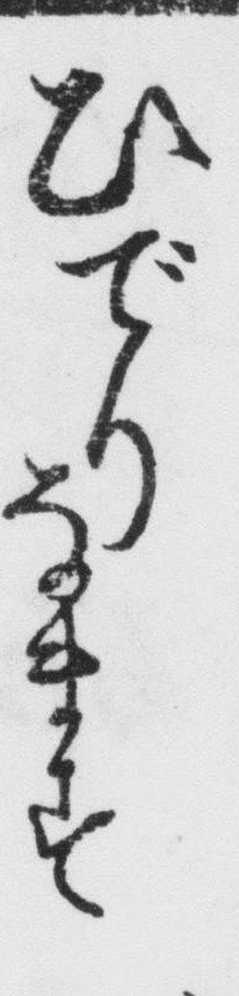ひでりなます
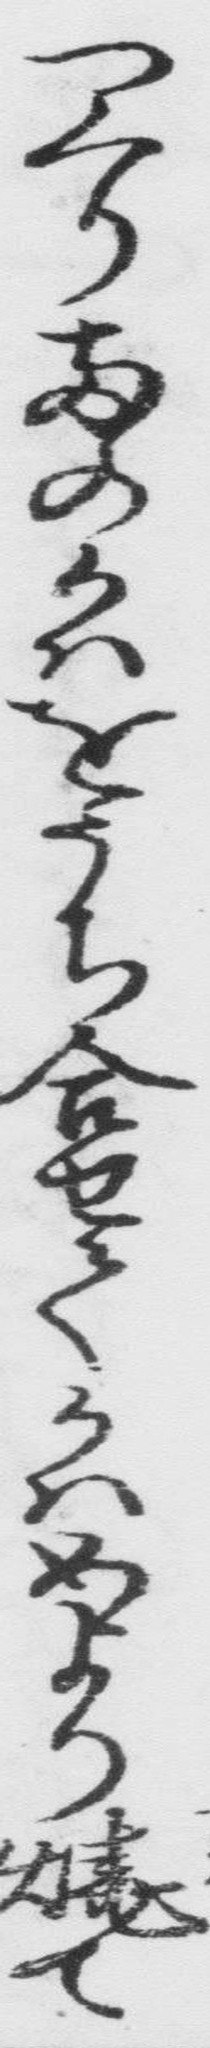つくり両のかはをうち合せてかはめより焼て
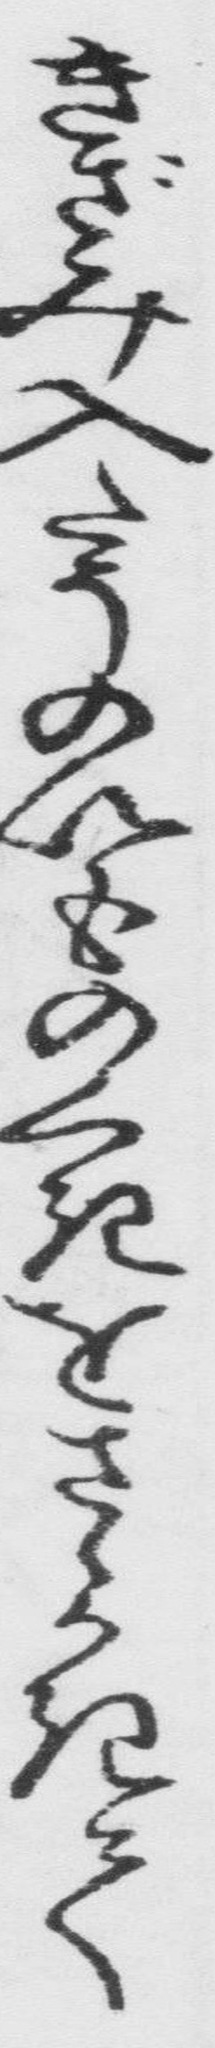きざみ入たうのいものくきをさゝかきて
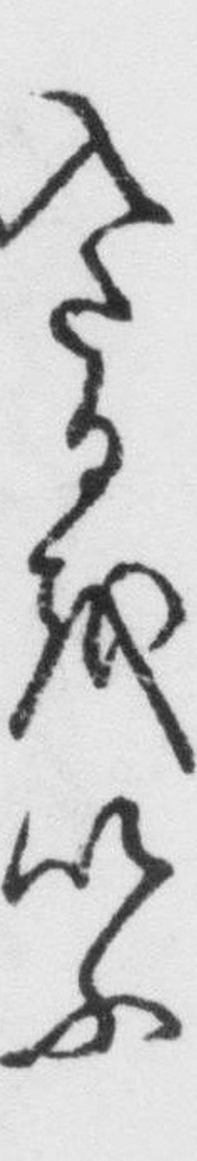入たるをいふ
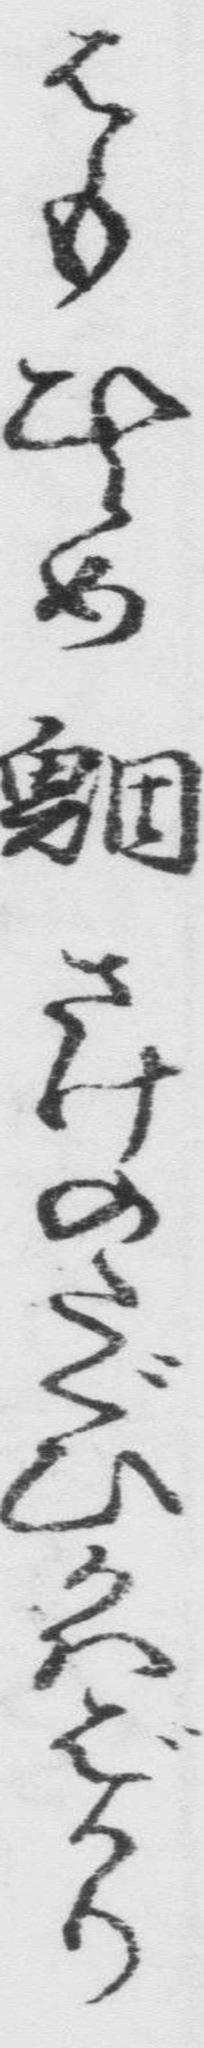はもひらめ鯛さけのたぐひかはばかり
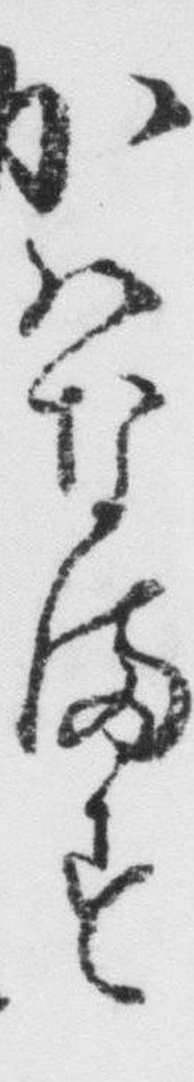かはなます
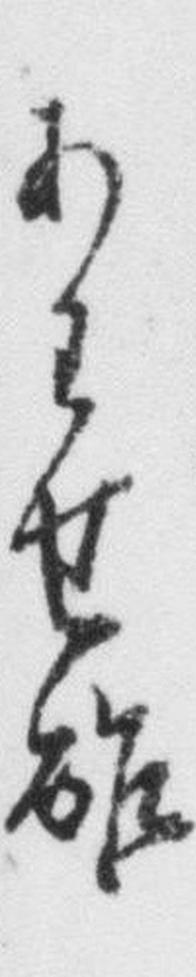あわせ酢
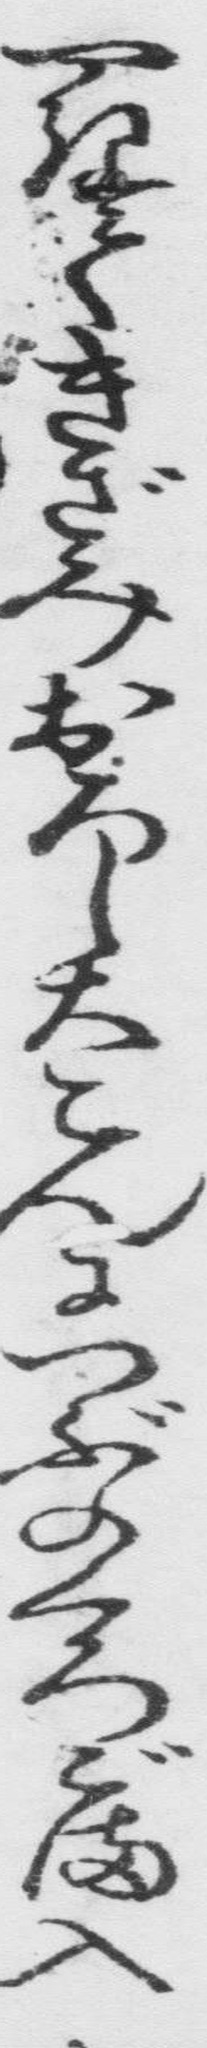やきてきざみおろし大こんにつぶのくろごま入
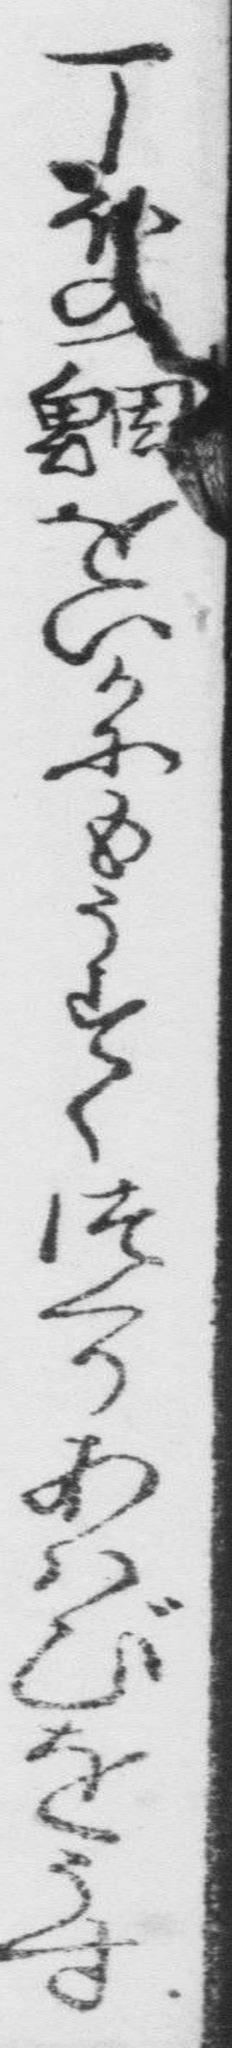一しほの鯛をいかにもうすくつくりあはびをうす
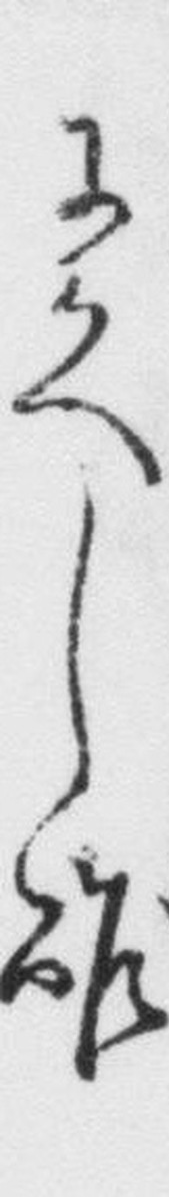にかへし酢
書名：料理早指南
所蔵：大阪府立大学学術情報センター 国文学研究資料館
